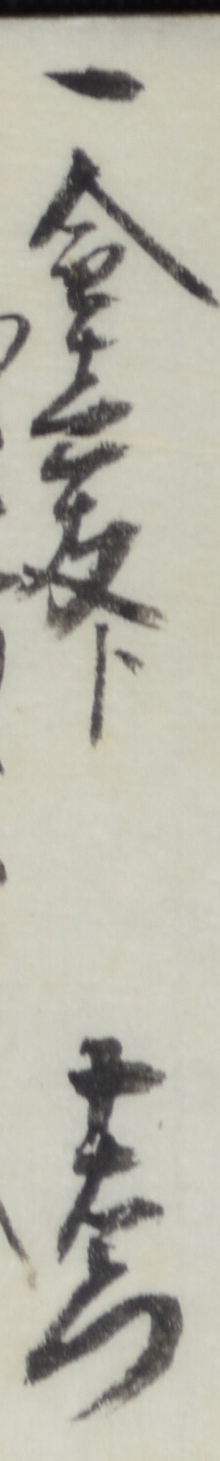一金壱両ト十右衛門
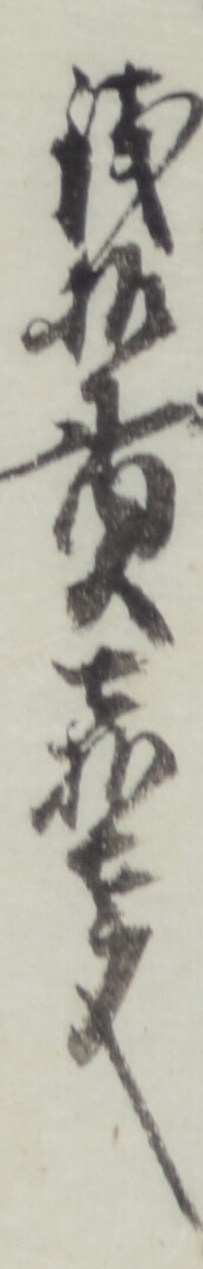銭拾貫七拾七文
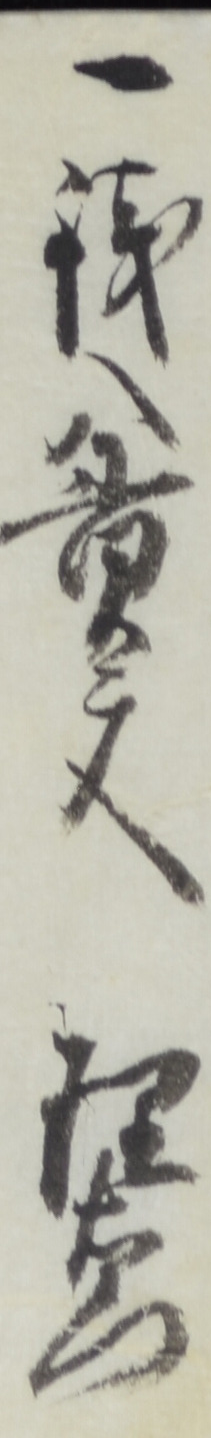一銭八貫文理右衛門
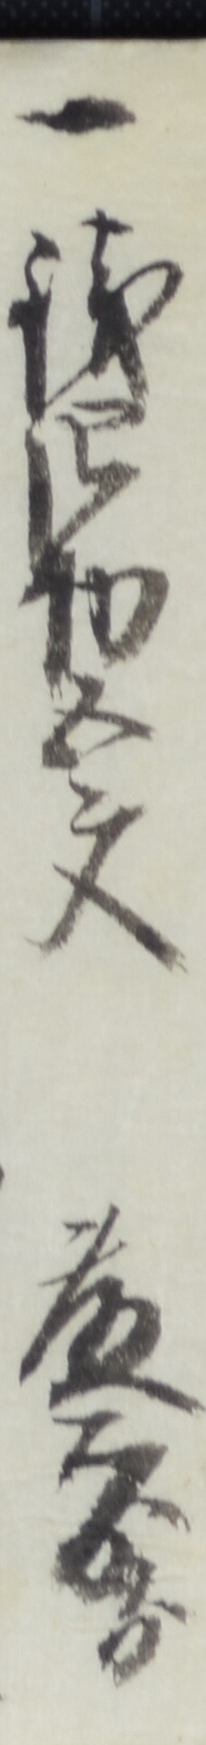一銭四百五文藤右衛門ゟ
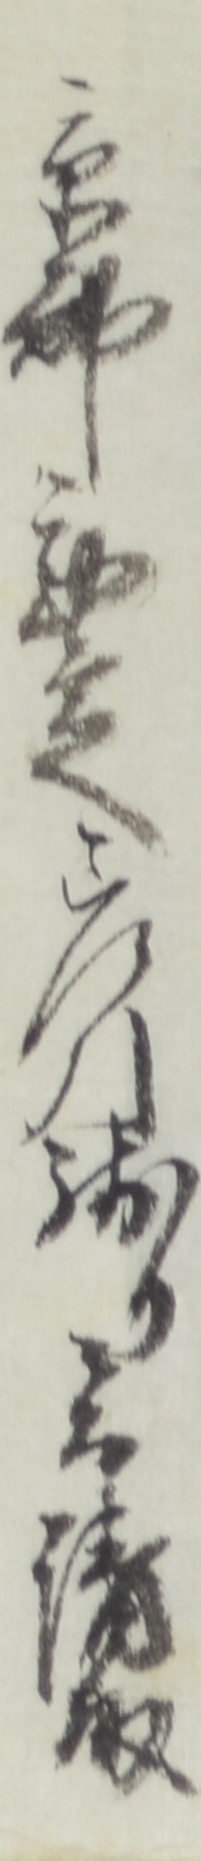京都勘定差引残りニ而請取
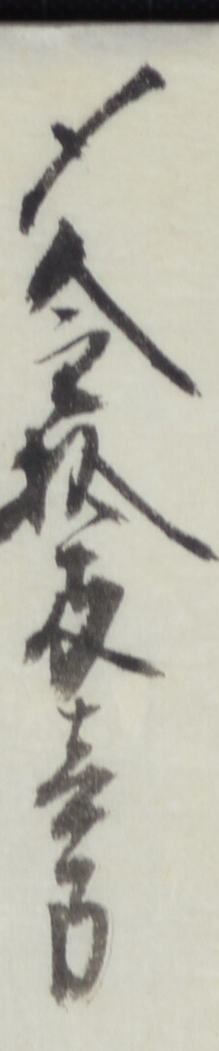〆金拾両壱分
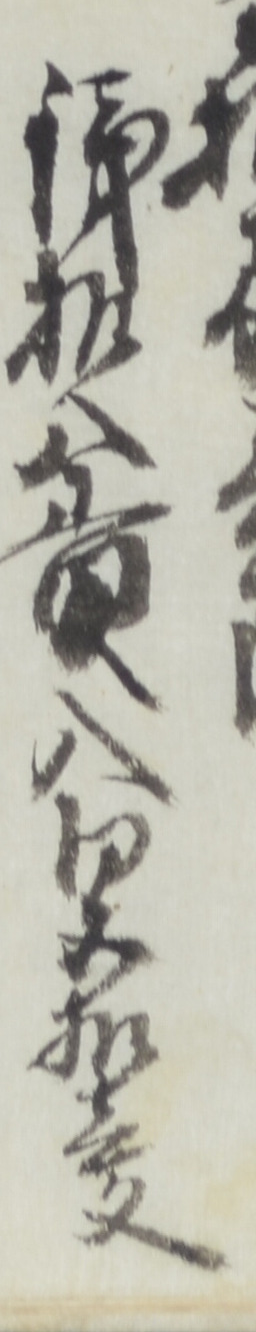銭拾八貫八百五拾壱文
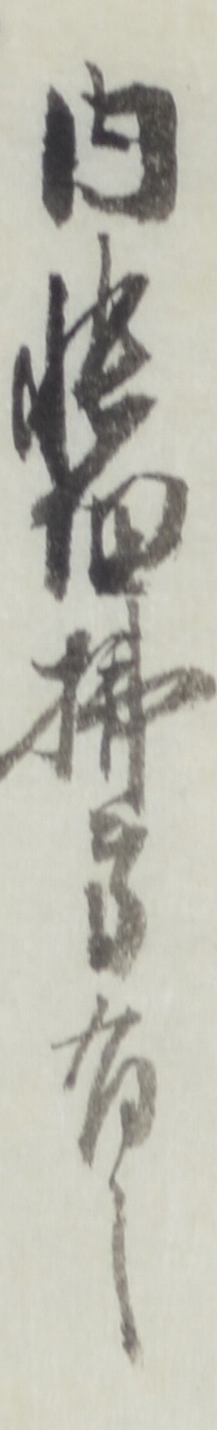内帳面払方有之
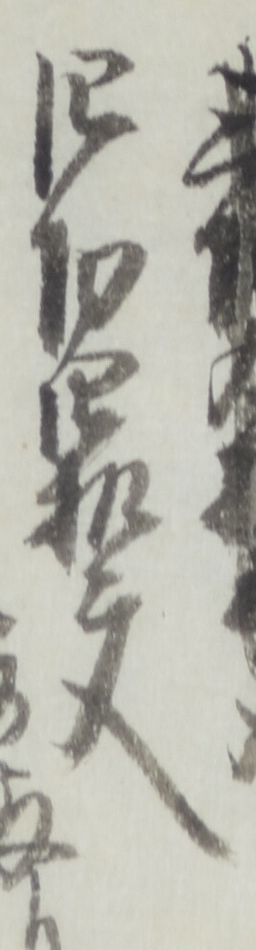四百四拾文
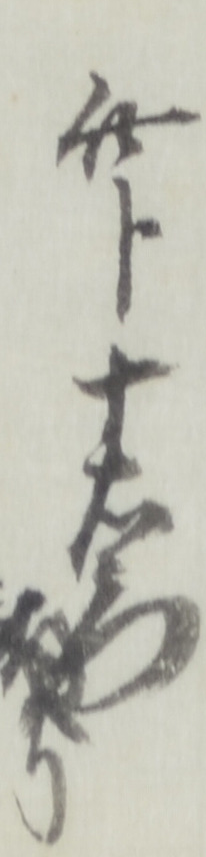此分十右衛門
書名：権現分拂方
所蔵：伊那市立高遠町図書館・合同会社AMANE
